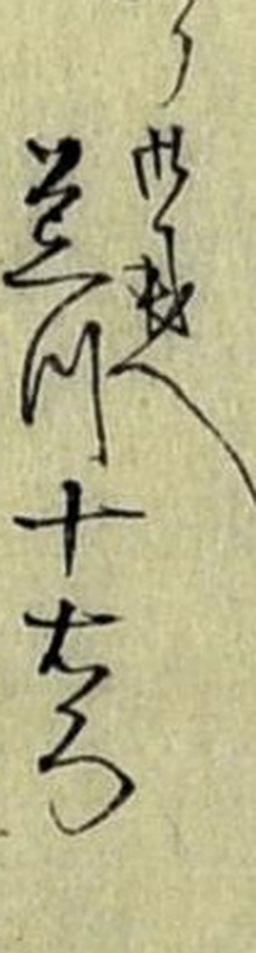荒川十右衛門
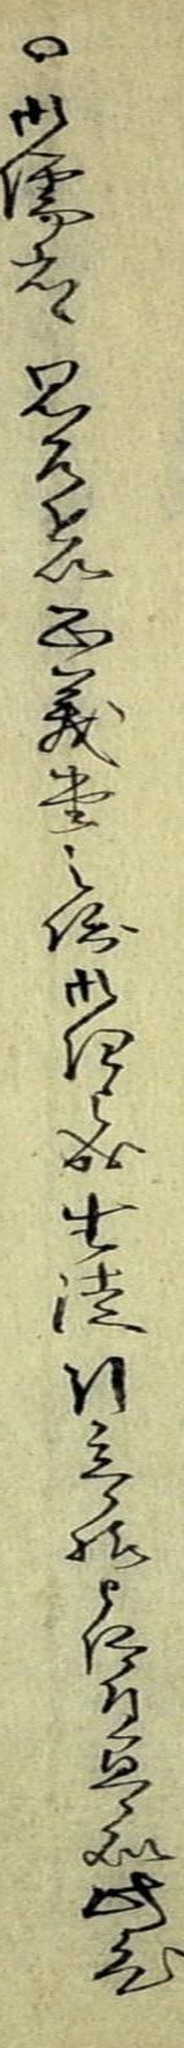○御儒者へ思召を以正義堂之儀御任被成生徒引立候様被仰付宜候処此度
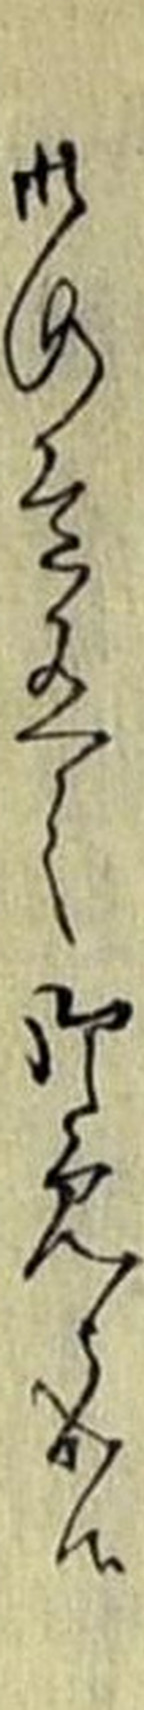御趣意有之御免被成候
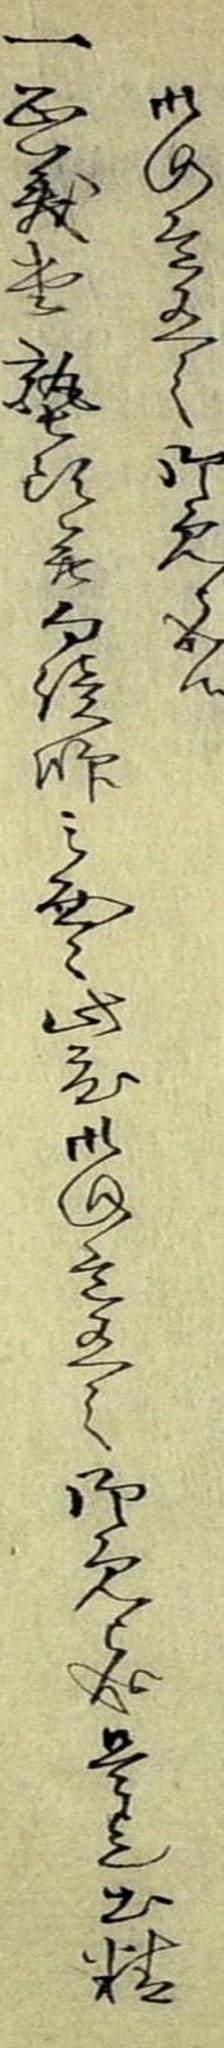一正義堂塾頭并句読師之面々此度御趣意有之御免被成是迄出精
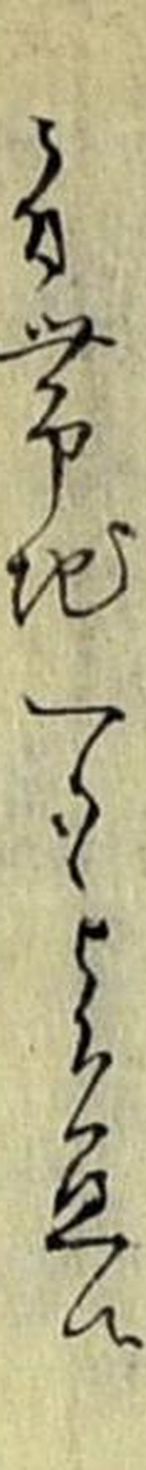ニ付帯地一ツヽ被下置候
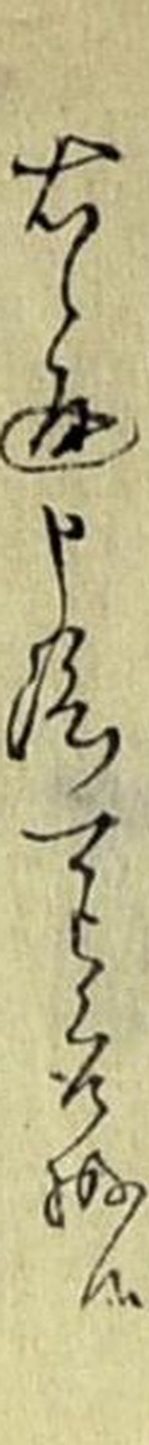右之通申渡可被取扱候
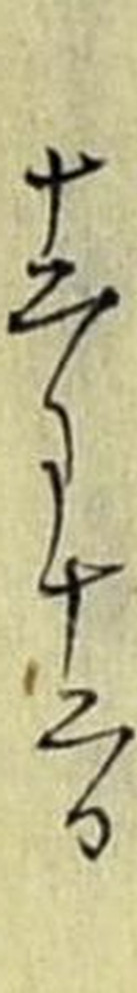十二月十二日
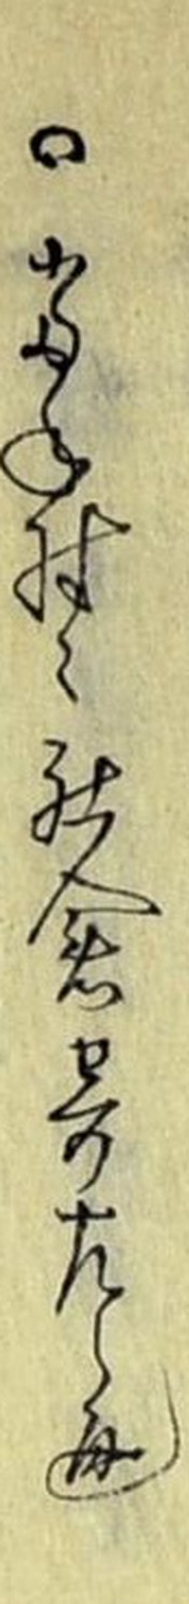○当年村々社倉寄左之通

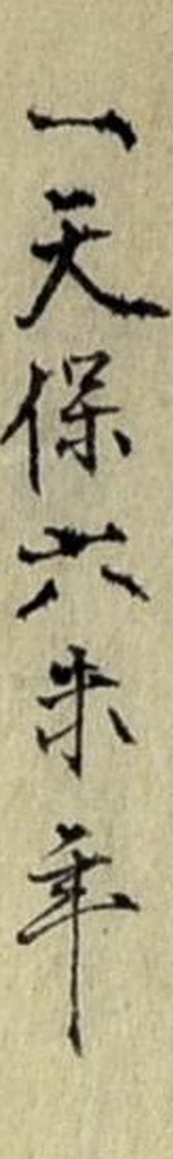一天保六未年
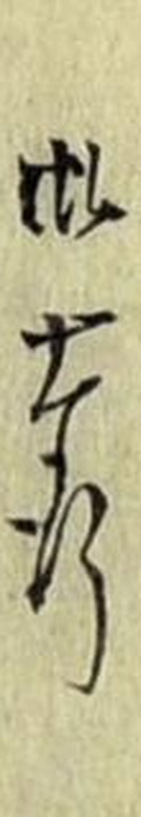御奉行
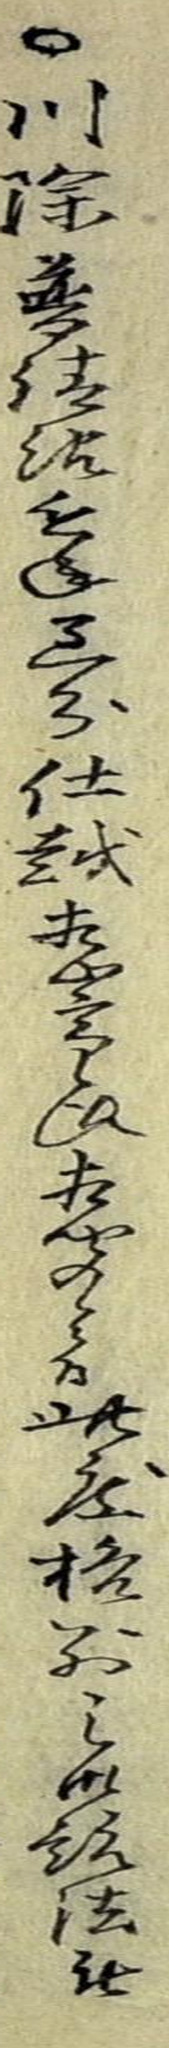○川除普請銀近年過分仕越相嵩候趣相聞候ニ付此度格別之御趣法被
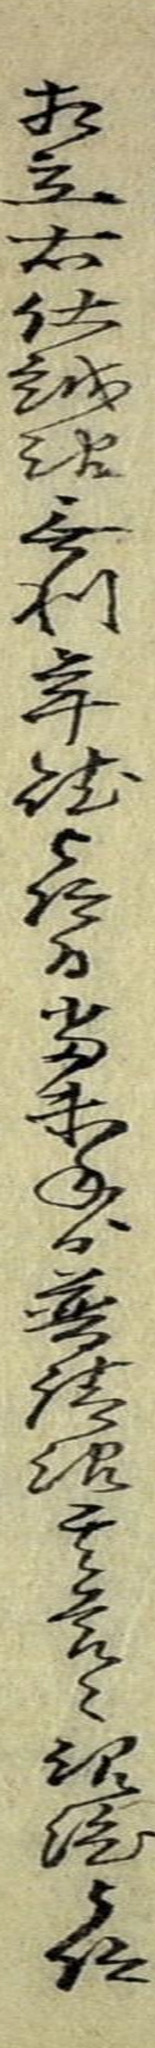相立右仕越無利年賦被仰付当未年ゟ普請銀其節ニ銀渡被仰
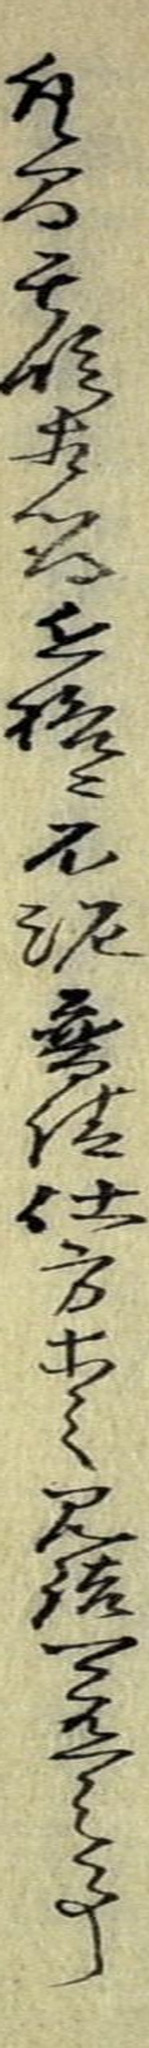付候間其段相心得近格ニ不泥普請仕方等之見詰可有之事
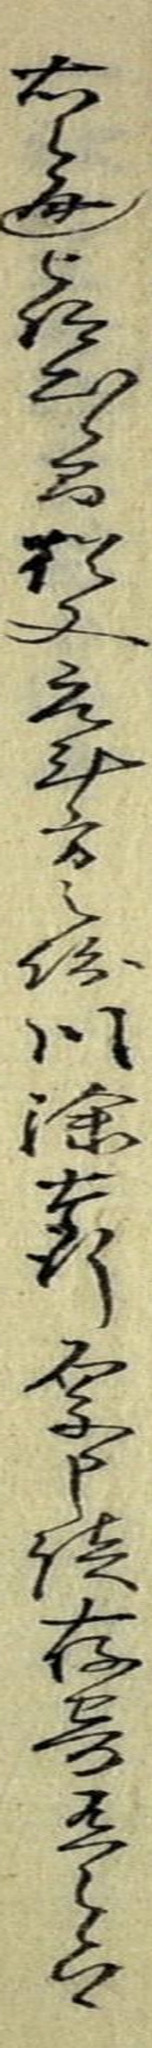右之通被仰出候間猶又取計方之儀川除奉行厚申談存寄有之候ハヽ
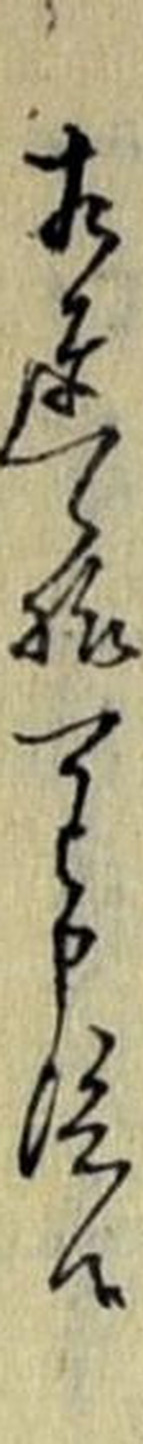相達候様可被申渡候
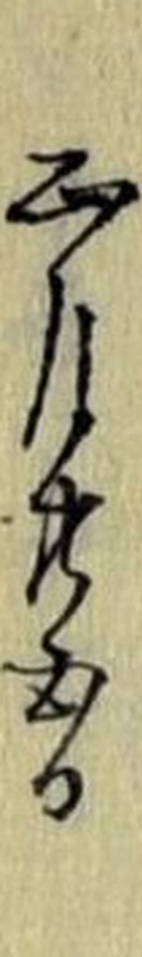正月廿五日
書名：命令之部 五
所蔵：福井県文書館 Fukui Prefectural Archives
